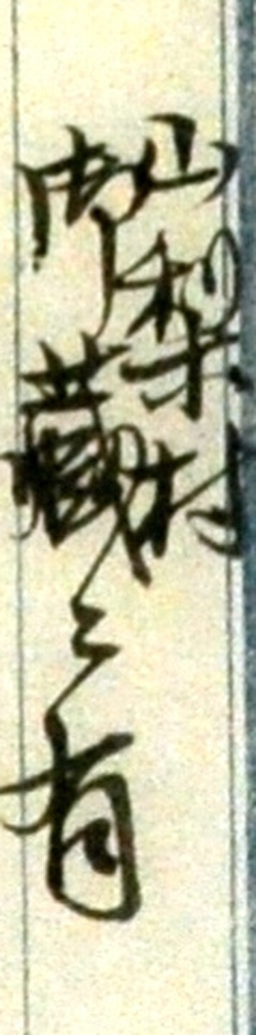御蔵ニ有
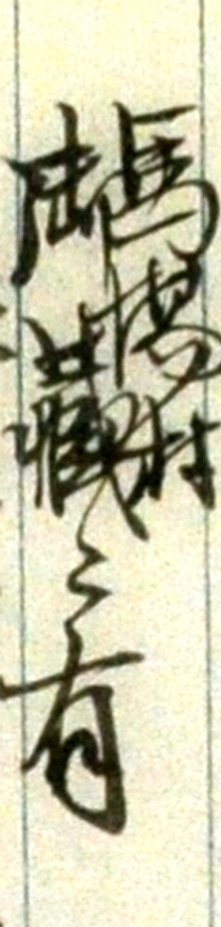御蔵ニ有
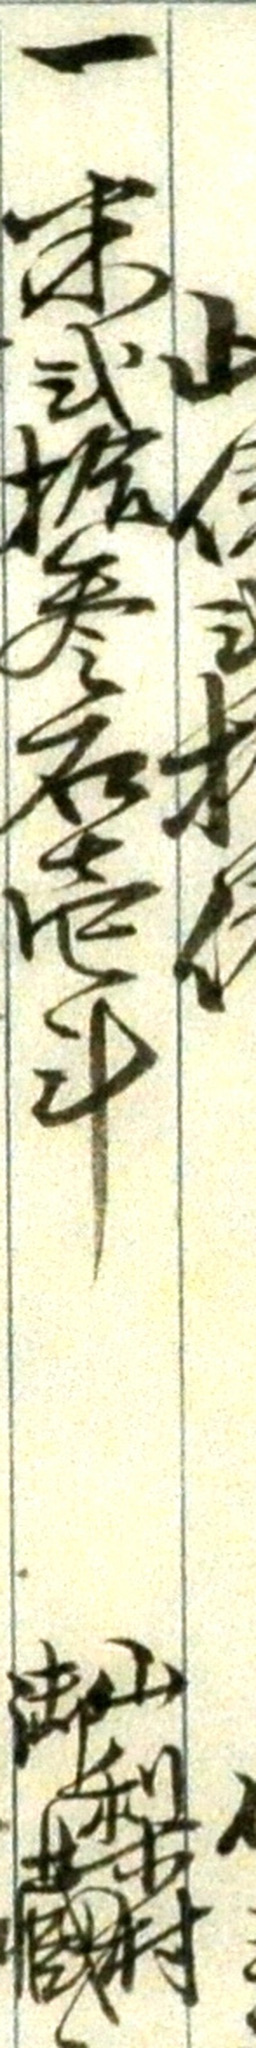一米弐拾参石壱斗山梨村
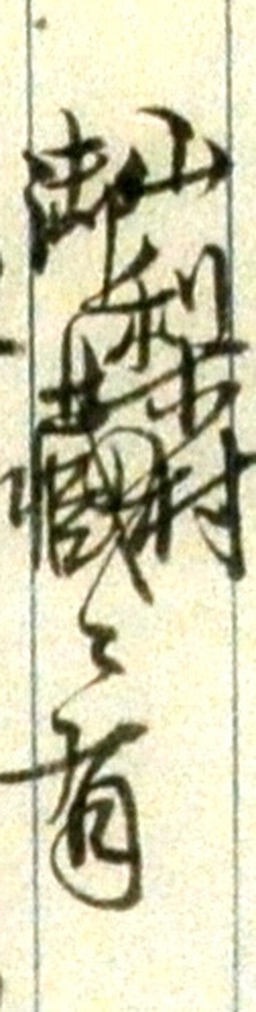御蔵ニ有
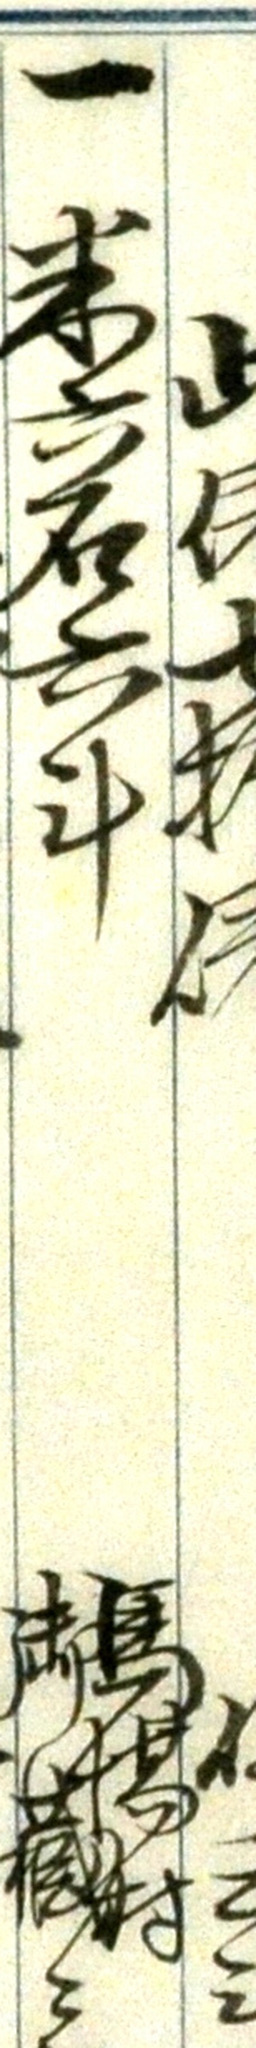一米六石六斗馬場村
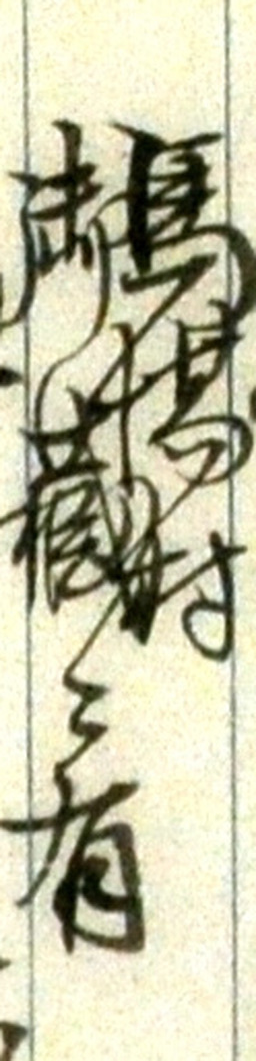御蔵ニ有
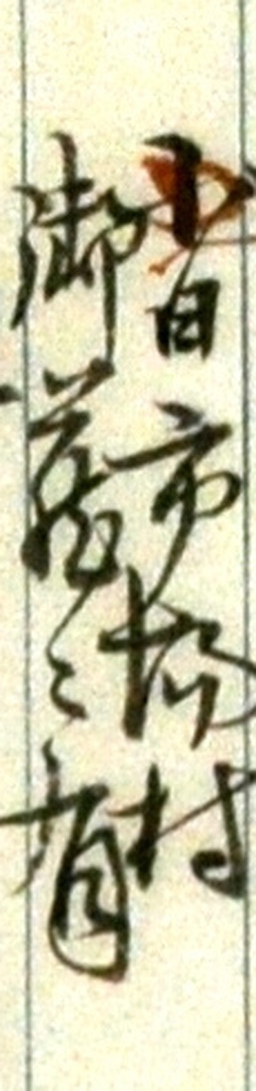御蔵ニ有
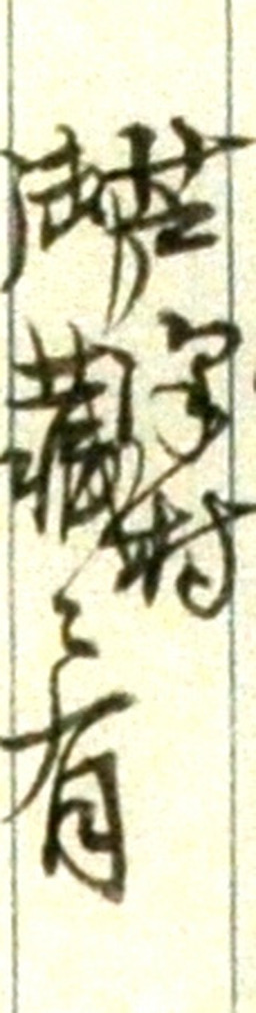御蔵ニ有
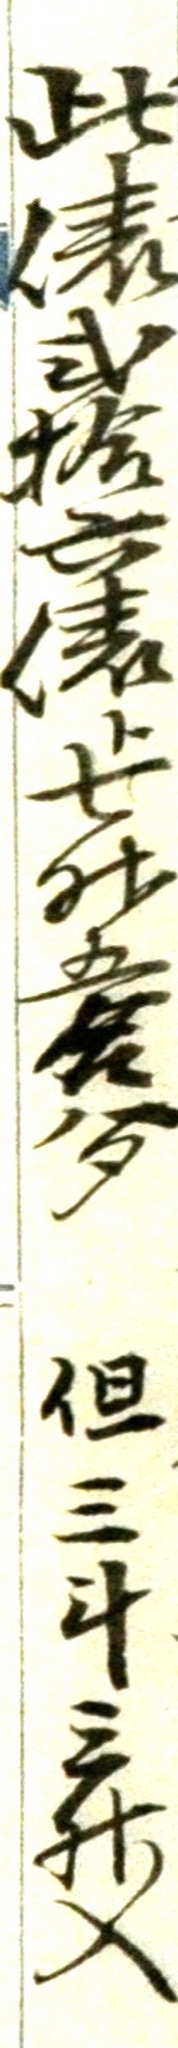此俵弐拾六俵ト七升五合八勺但三斗三升入

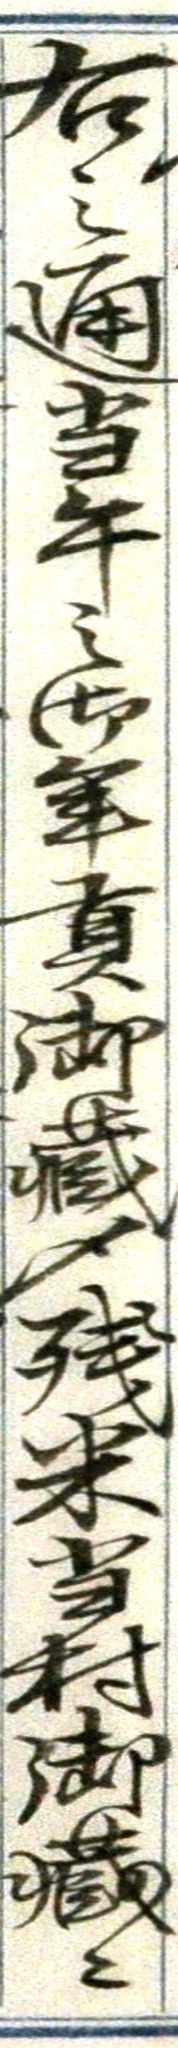右之通当午之御年貢御蔵〆残米当村御蔵ニ
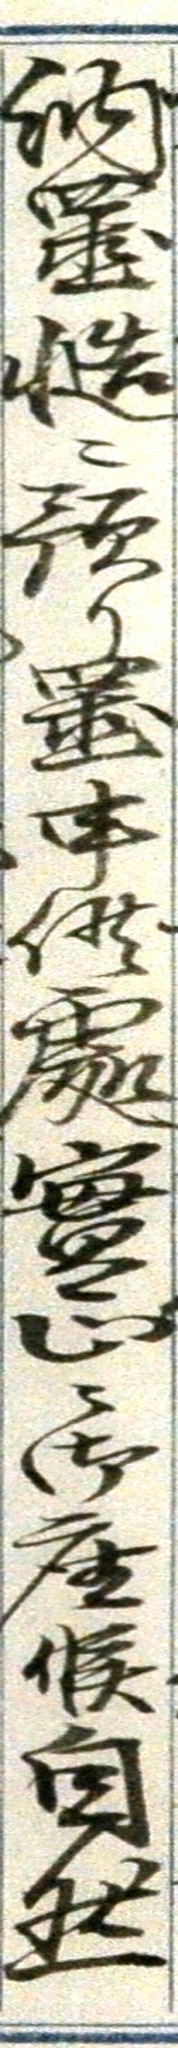納置慥ニ預り置申候処実正ニ御座候自然
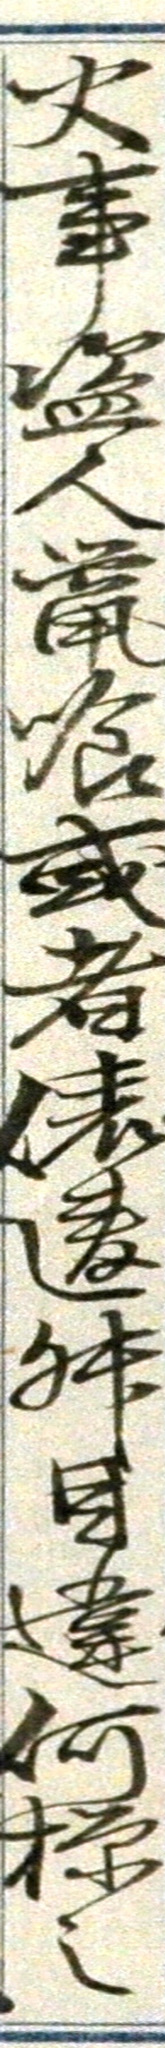火事盗人鼡喰或者俵違升目違何様之
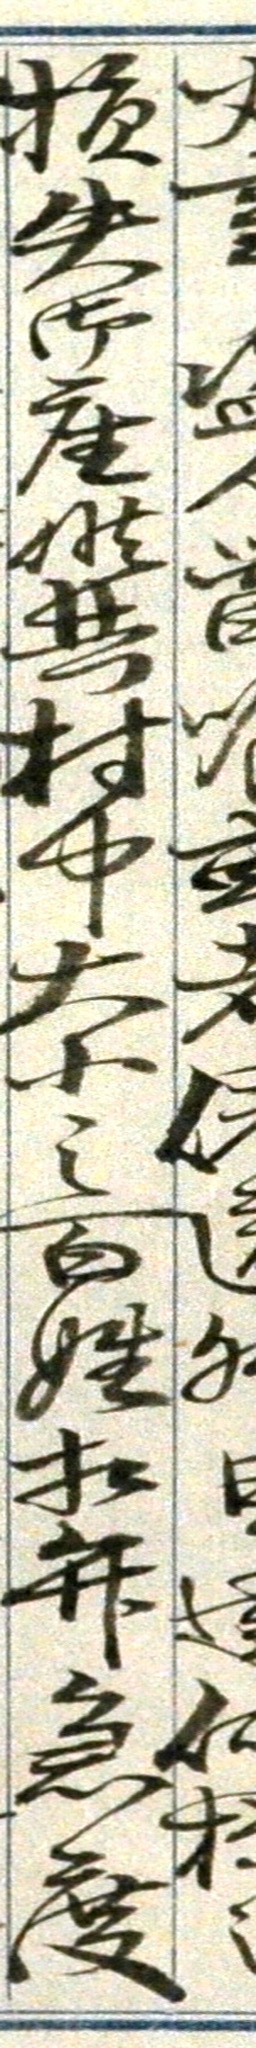損失御座候共村中大小之百姓相弁急度
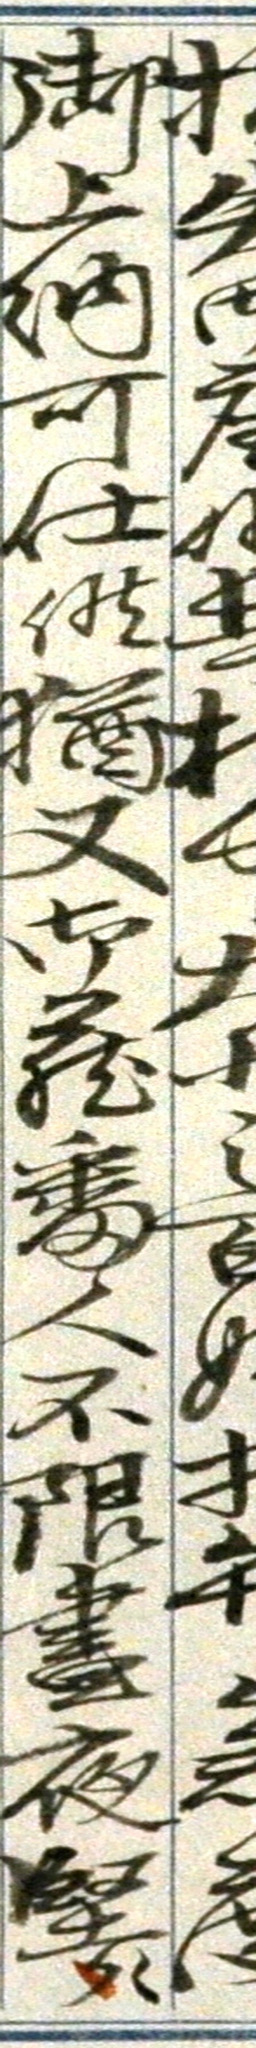御上納可仕候猶又御蔵番人不限昼夜堅く
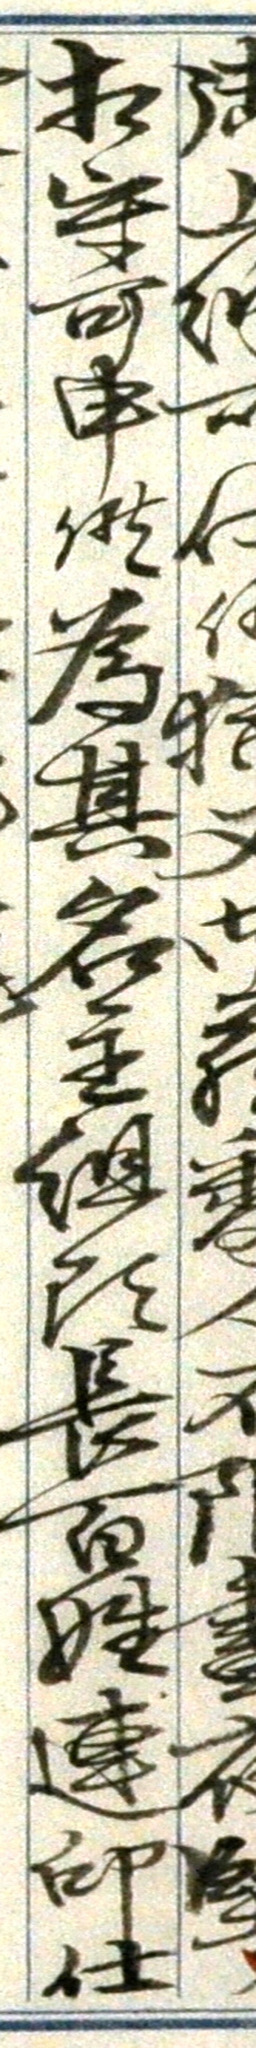相守可申候為其名主組頭長百姓連印仕
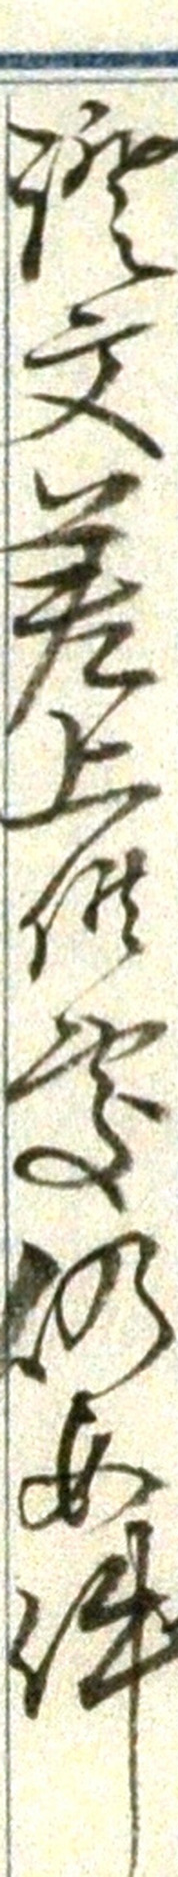証文差上候処仍如件
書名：御蔵〆目録・御年貢御上納目録
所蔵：伊那市立高遠町図書館・合同会社AMANE
